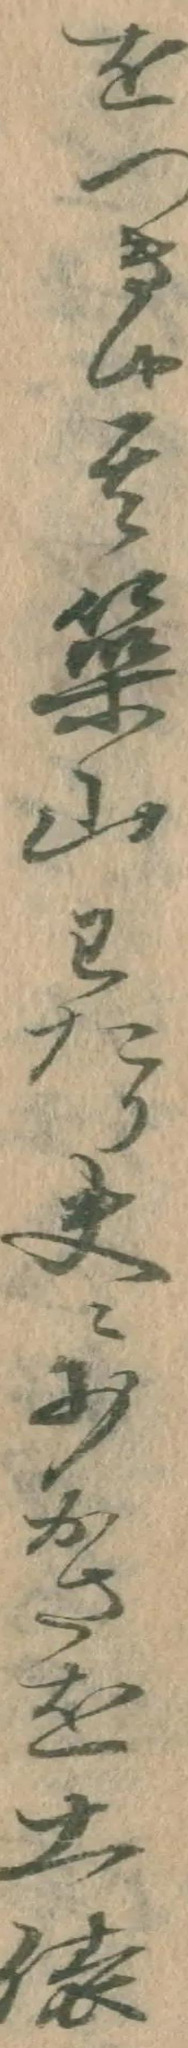をつき候其築山已たり夫に少かさを土俵
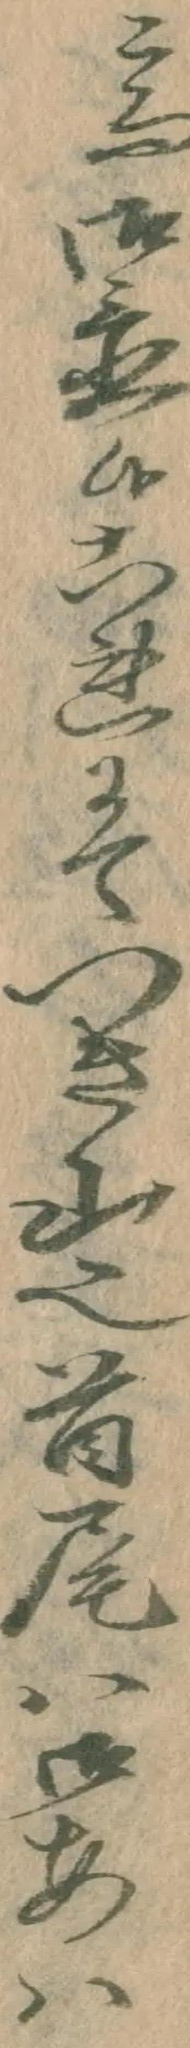に而御置候古連尓てつき山也首尾は御あは
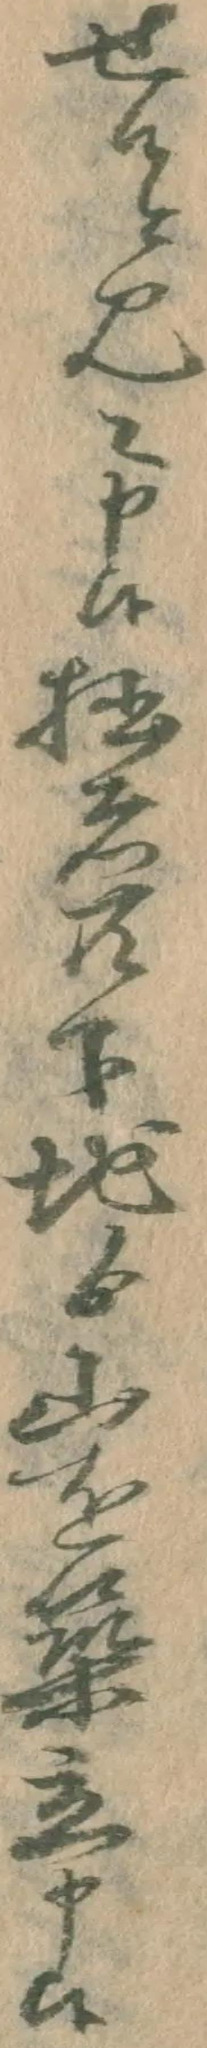せ候と見に申候拙者共下地ゟ山を築立申候
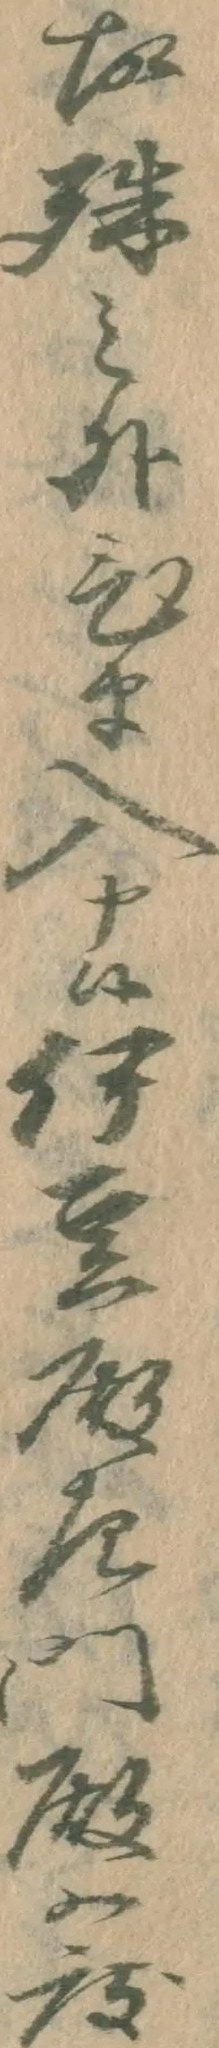故殊之外飛ま入申候伊豆殿左門殿は度
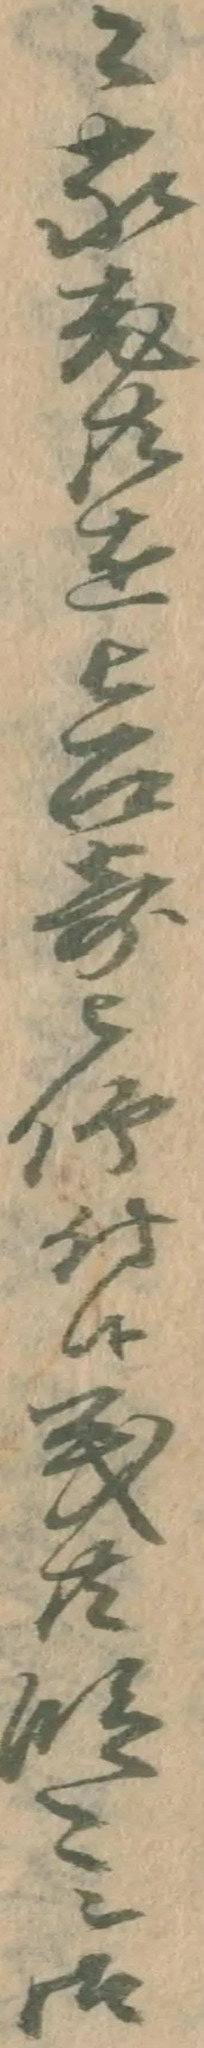々家老共を被召寄被仰付候義共明々し御
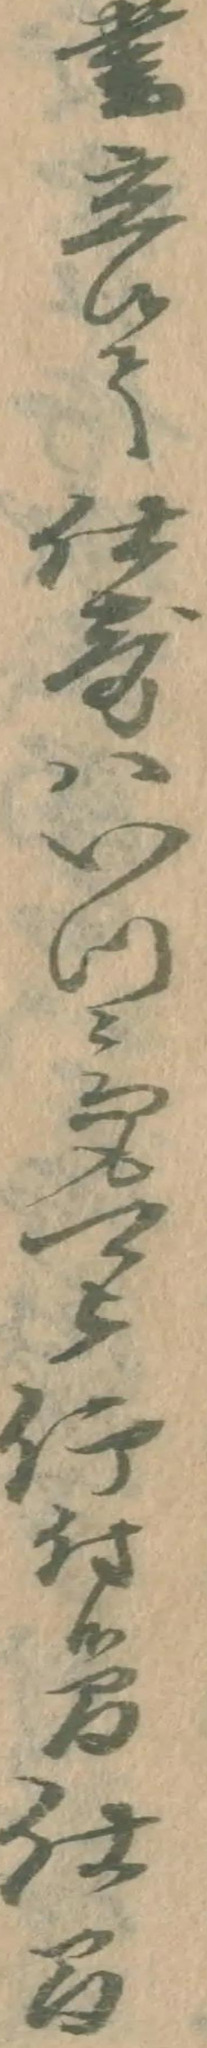書立候て仕寄はい川に而も可被仰付候間仕間

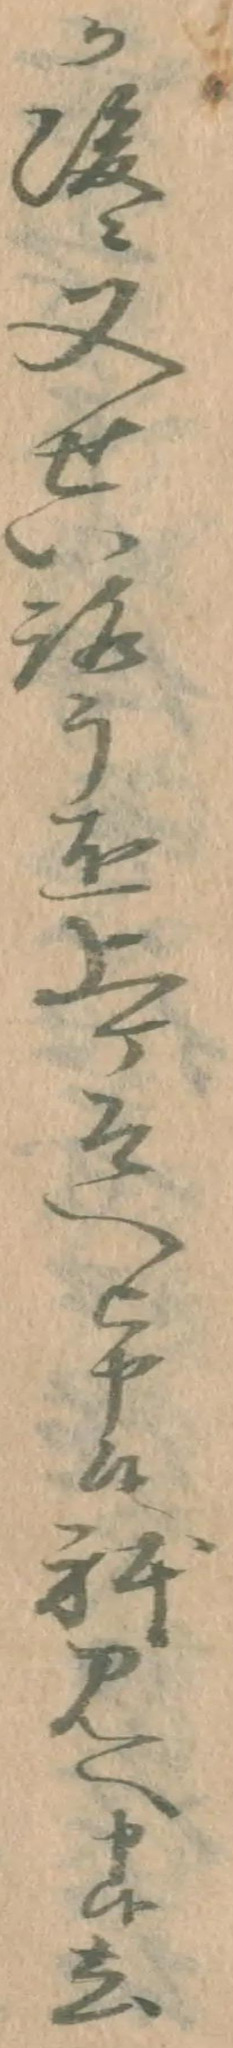か後に又せい路うを上けそへ被申候躰見へ申候去
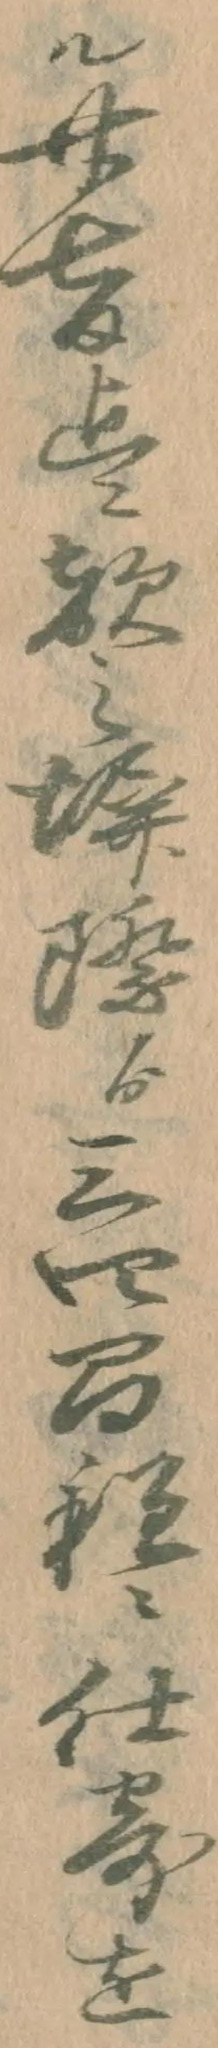る廿七日迄に敵之塀際ゟ三四間程に仕寄を
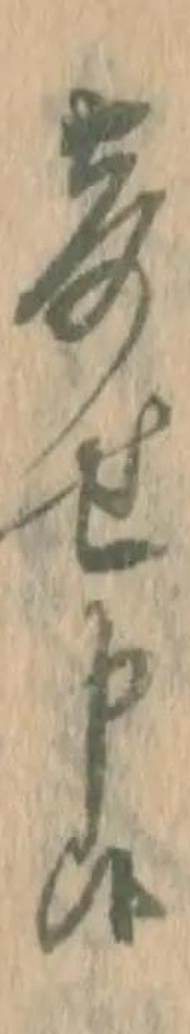寄せ申候
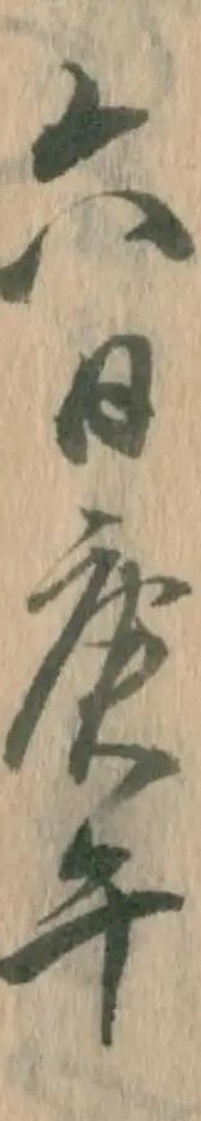六日庚午
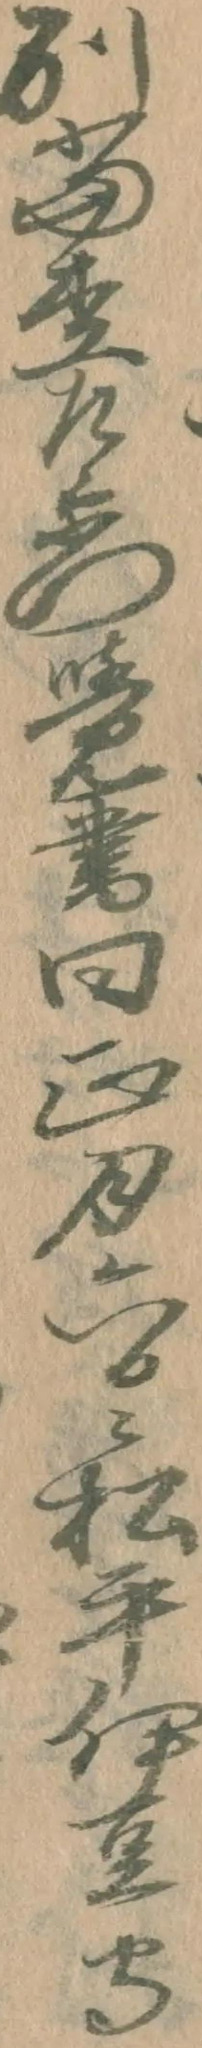別当杢左衛門覚書曰正月六日松平伊豆守
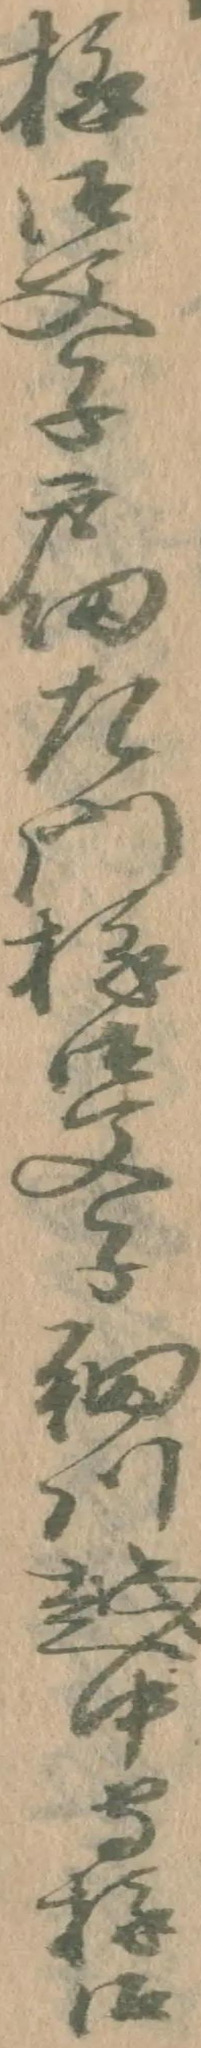様御父子戸田左門様御父子細川越中守様御
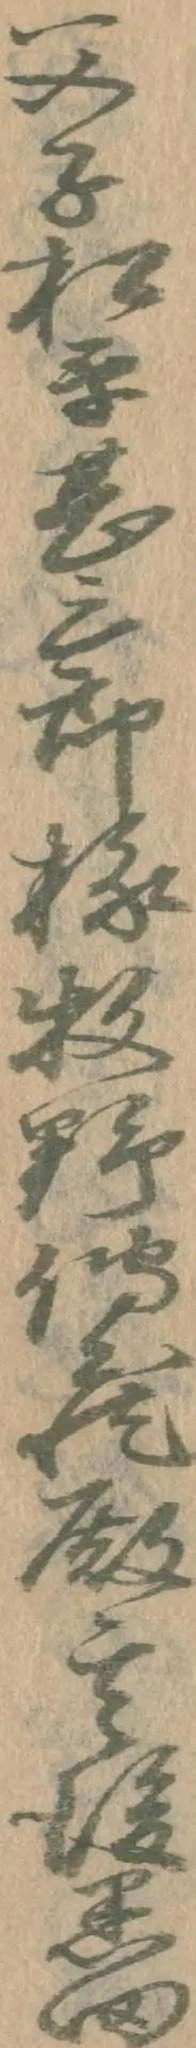父子松平甚三郎様牧野伝蔵殿其後黒田
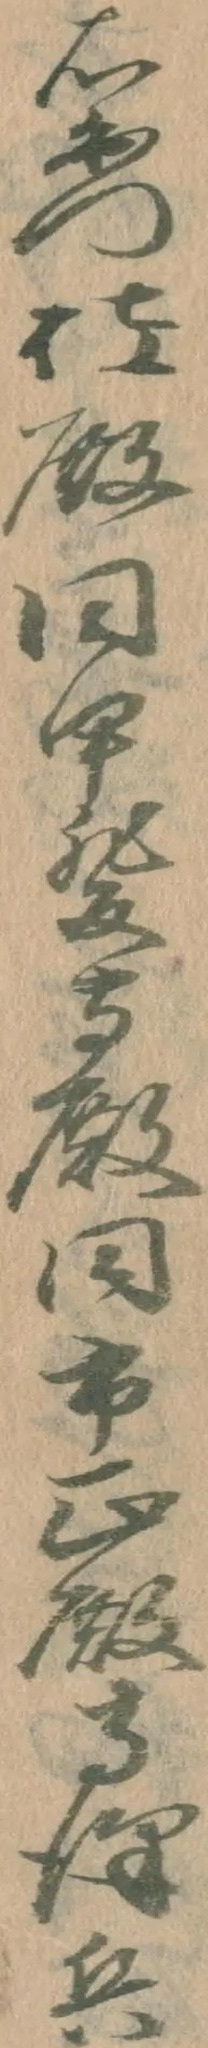右衛門佐殿同甲斐守殿同市正殿寺沢兵
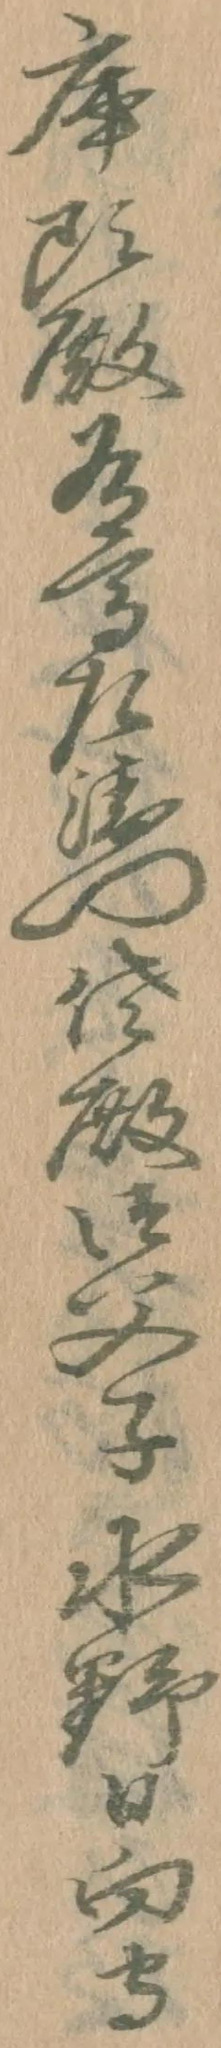庫頭殿有馬左衛門佐殿御父子水野日向守
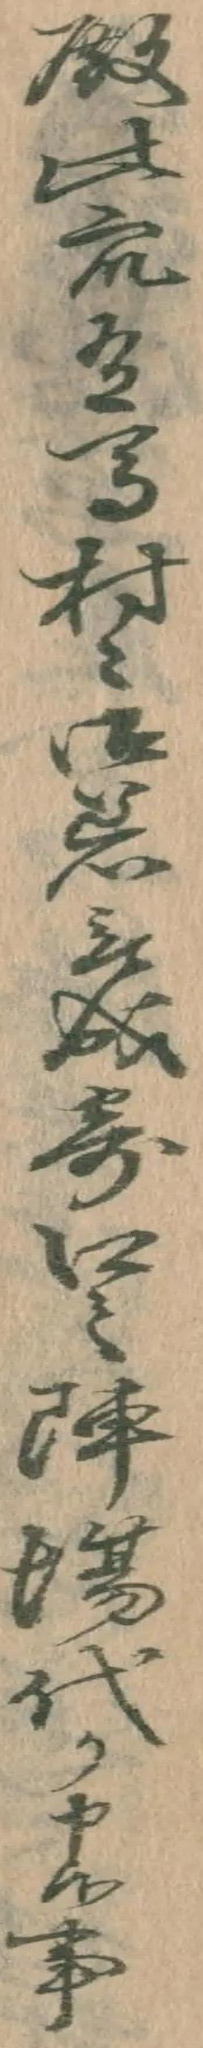殿此衆有馬村々御着被成寄口之陣場代り申候事
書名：切支丹御退治記 49巻. [5]
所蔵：国立国会図書館 National Diet Library, JAPAN
